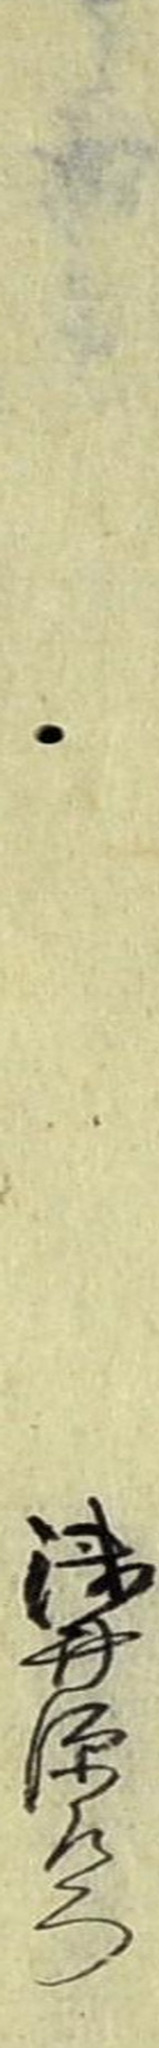浅井源左衛門
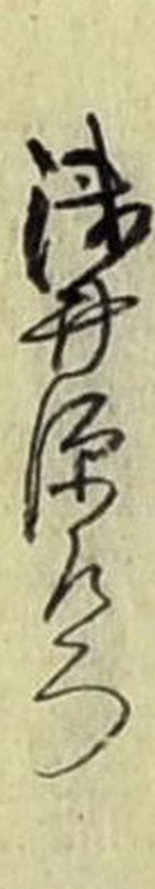浅井源左衛門
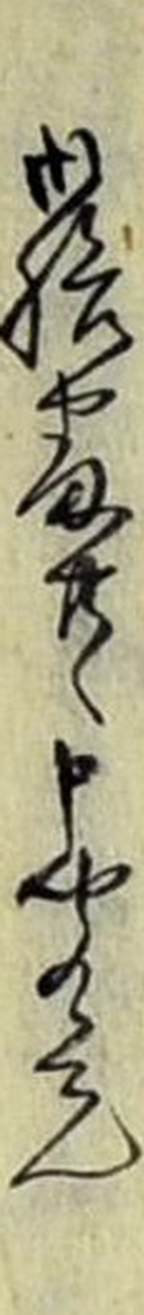御膳番共へ申聞覚
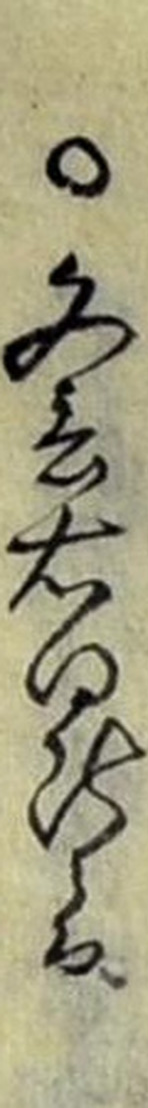〇文言右同断ニ而
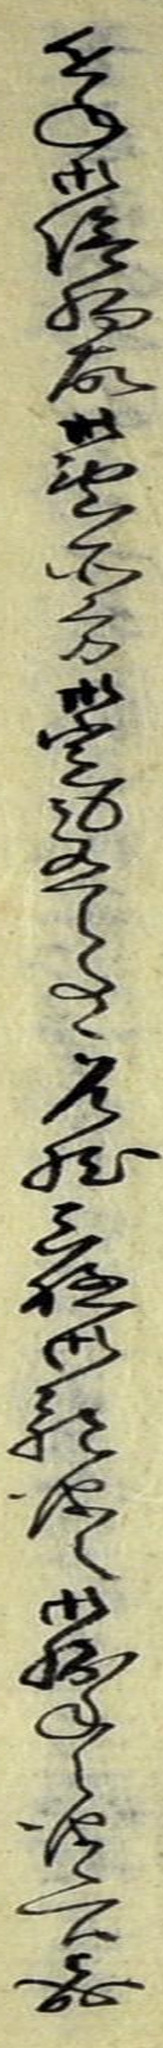近年御倹約故御台所方御定も有之事候乍然至極御難儀之御勝手之儀候ヘハ被成

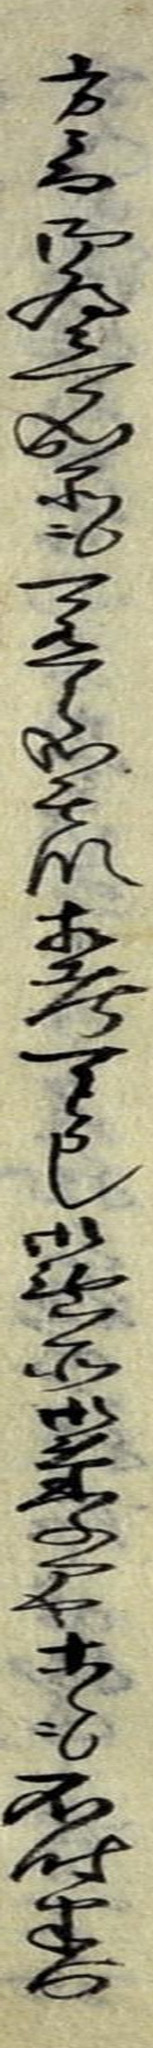方ニ而御為ニ可成品も可有之哉其段相考可被申候御台所御菓子部屋等へも不時半右衛門
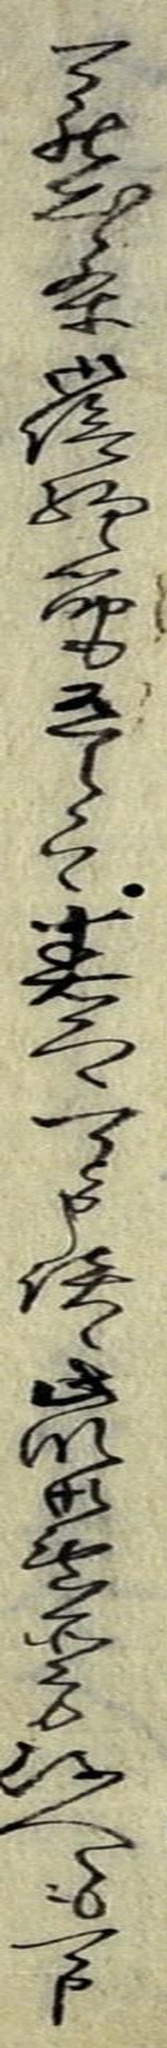可罷出候条御倹約之筋も有之候ハヽ半右衛門へ可被申談候此段御台所方役人へも可申
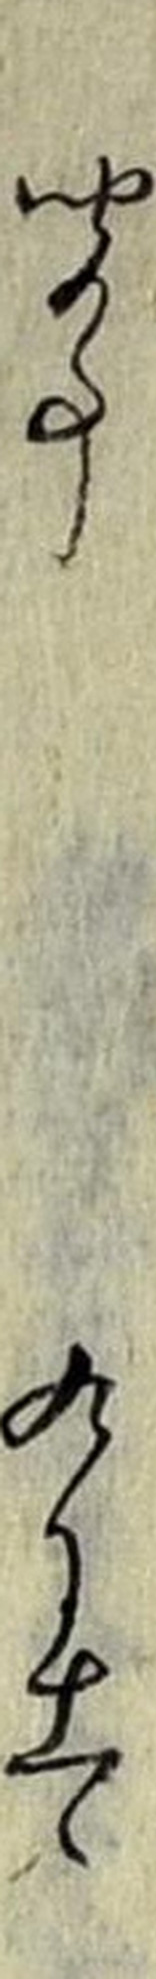聞事九月十一日
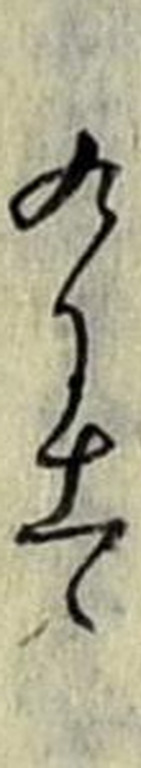九月十一日
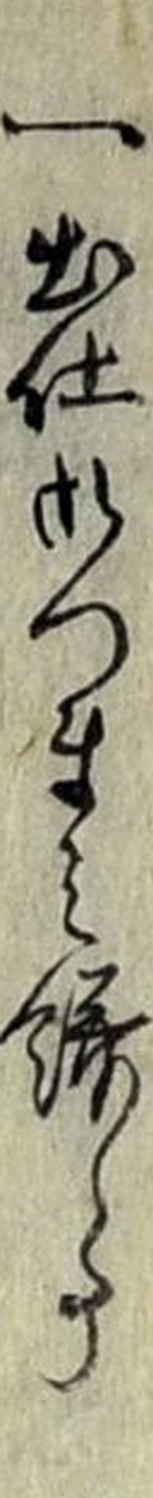一出仕御門主之餅之事
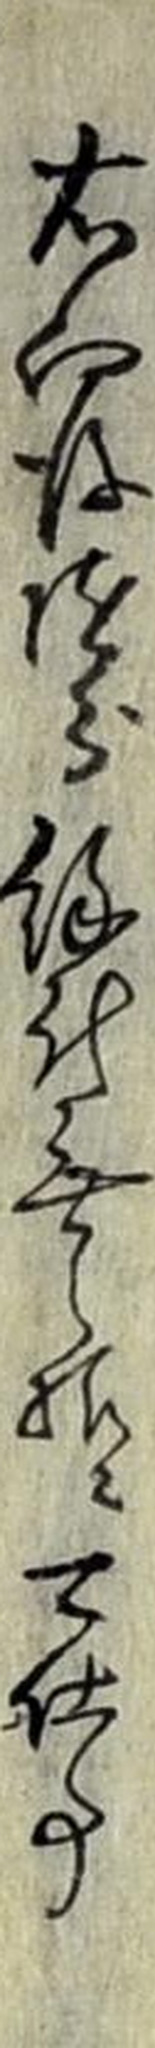右向後随分余計無之様ニ可仕事
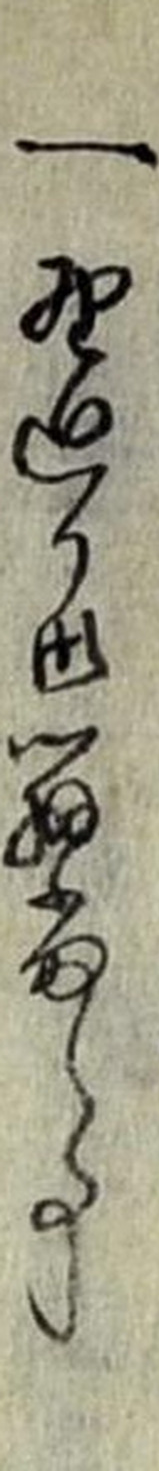一野廻り御弁当之事
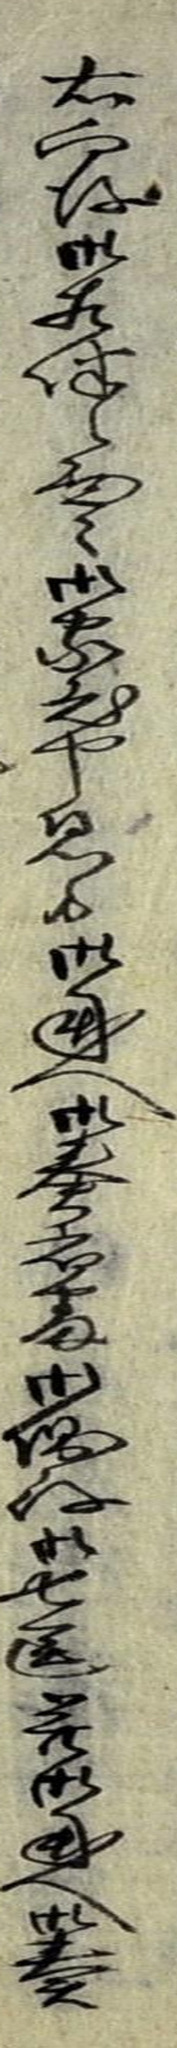右向後御相伴之面々御家老中息方御用人御奏者番御側役御匕医并御用人御奏
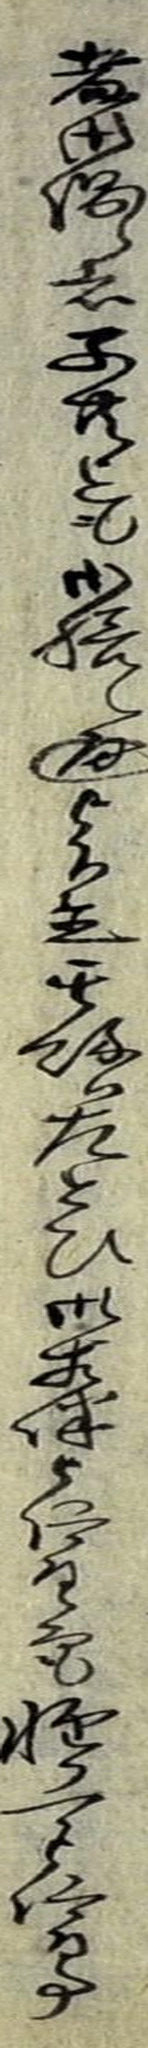者御側之者子共迄も御膳之通被下置其余ハたとひ御相伴被仰付候而も軽ク可被仰付事
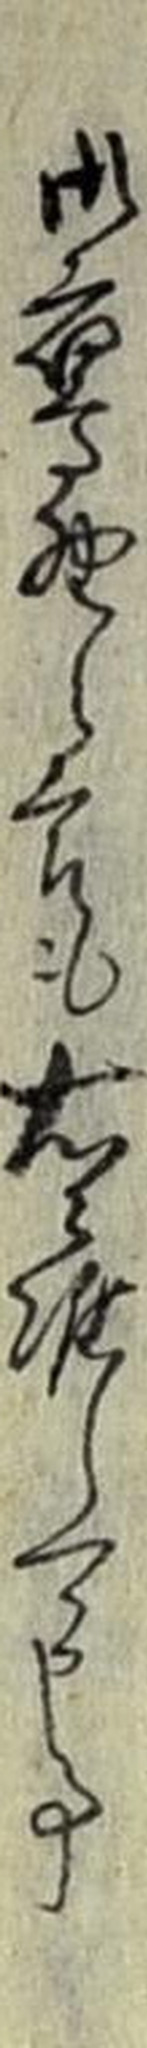御鷹野之節も右ニ准し可申事
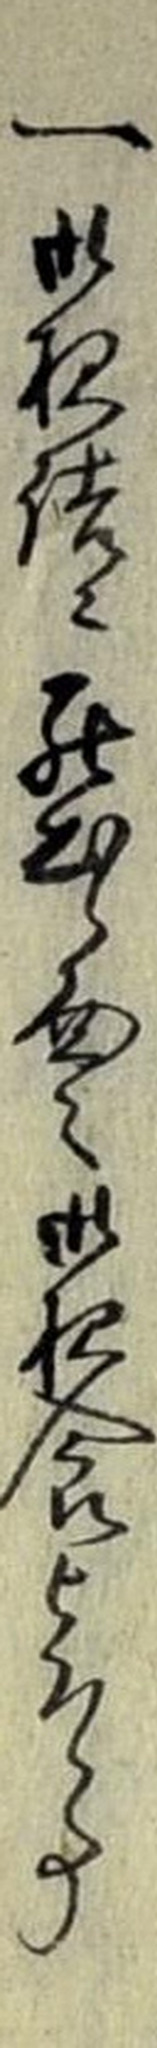一御夜詰ニ罷出候面々御夜食被下事
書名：命令之部 一
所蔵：福井県文書館 Fukui Prefectural Archives
